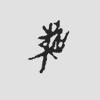桑
